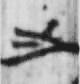之
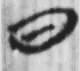日
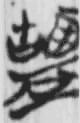○（盬）
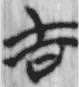吉
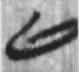㠯（以）
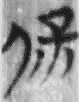保
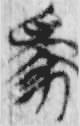○（家）
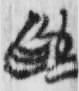爲
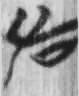左
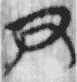尹
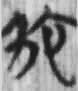{力它}
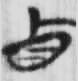貞
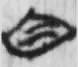自
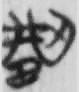荊（荆）
